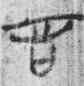言
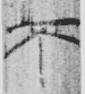不
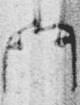夂（終）
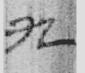九
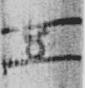五
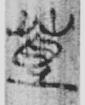莧
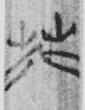○（陸）
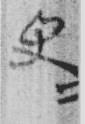夬夬
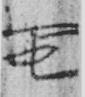𠁩
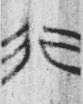行
